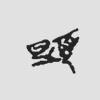夏
